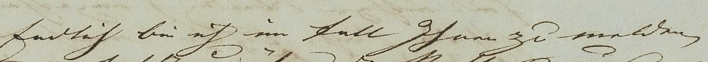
Endlich bin ich im Fall Ihnen zu melden,
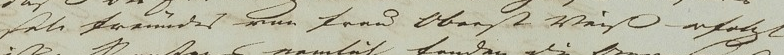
sel. Freundes von Frau Oberst Weiß erfolgt
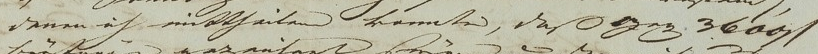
denen ich mittheilen konnte, daß gegen 3600 fl
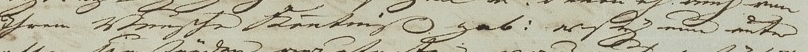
Ihrem Wunsche Kenntniß gab: es sey nun unter
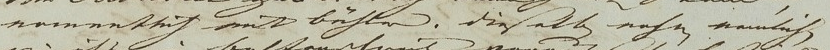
namentlich mit Bühler. Dieselben nahmen nemlich,
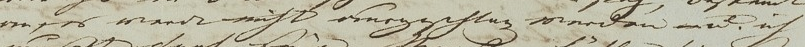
an, es werde nicht ausgeschlagen werden u. ich
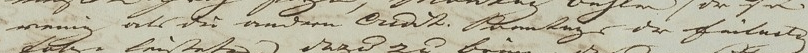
wenig als die andern Credit. Sonntags der Einladg
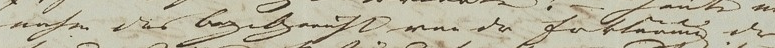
nahm das Bez. Gericht von der Erklärung der
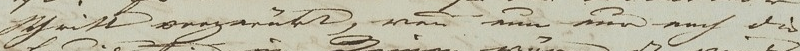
Schritt vorgerükt, wenn nun nur noch die
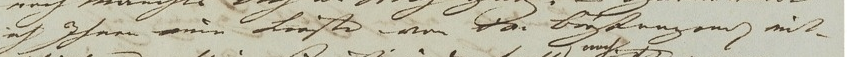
ich Ihnen eine Lieste von den Beytragenden mit-
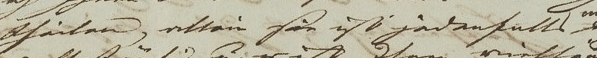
theilen, allein sie ist jedenfalls
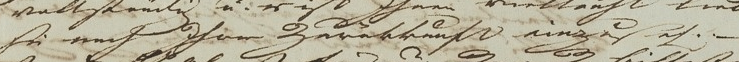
sie nach Ihrer Zurükkunft einzusehen. –
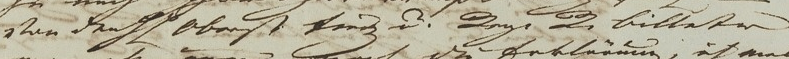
Von den HH Oberst Fierz u. Reg.R. Billeter
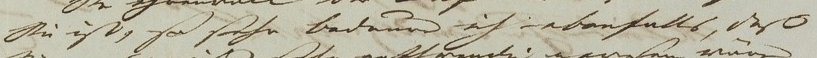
Sie ist, so sehr bedaure ich ebenfalls, daß
